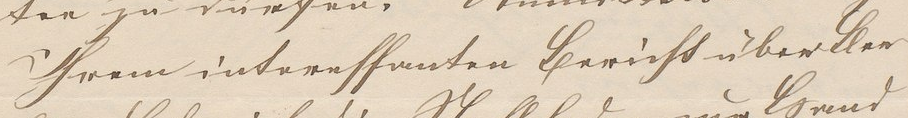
Ihrem interessanten Bericht über Ber-
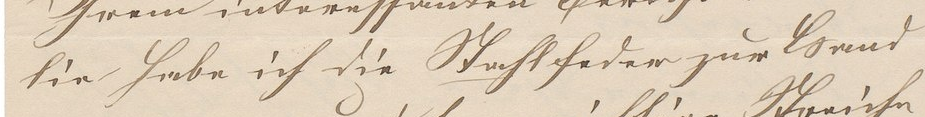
lin habe ich die Stahlfeder zur Hand
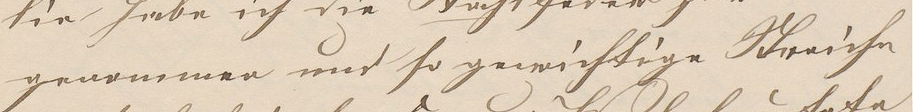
genommen und so gewichtige Streiche
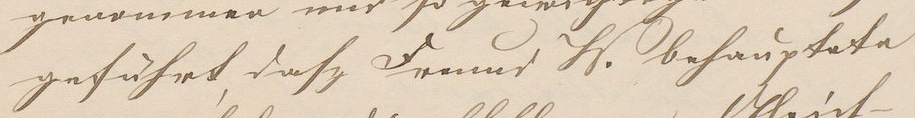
geführt, dasz Freund W. behauptete
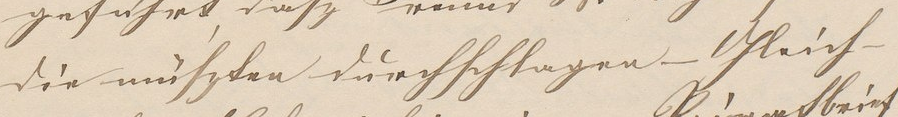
die müszten durchschlagen – Gleich-
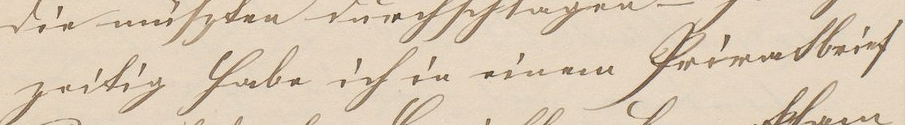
zeitig habe ich in einem Privatbrief
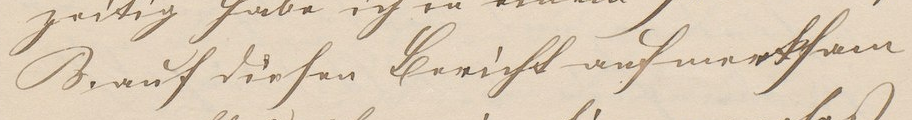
B. auf diesen Bericht aufmerksam
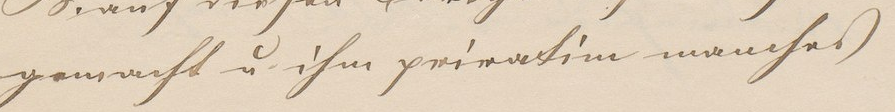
gemacht u ihm privatim manches
